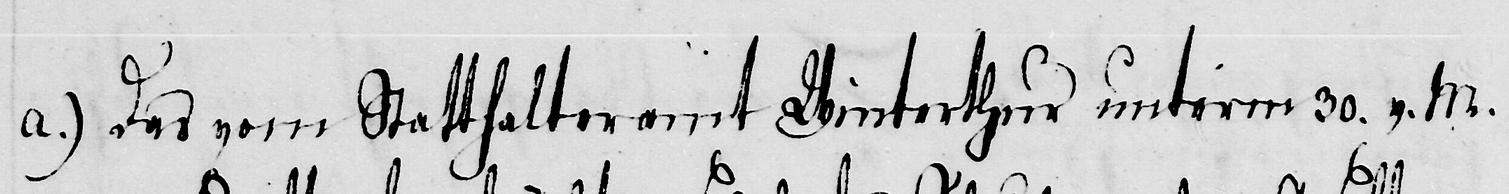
a.) Das vom Statthalteramt Winterthur unterm 30. v. M.
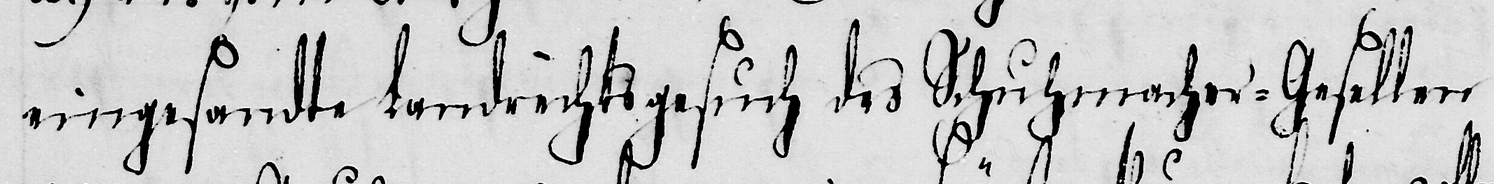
eingesandte Landrechtsgesuch des Schuhmacher-Gesellen
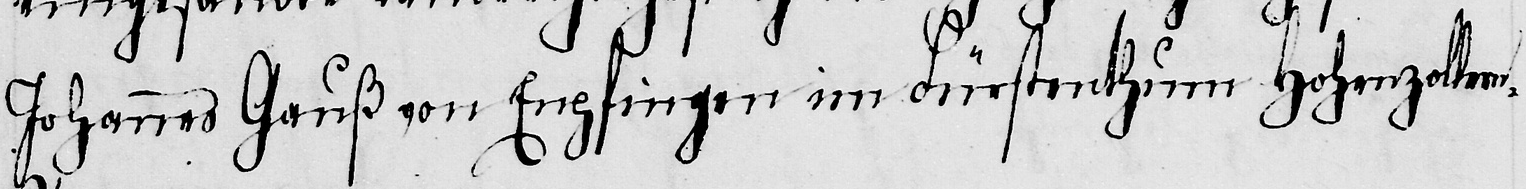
Johannes Gauß von Enpfingen im Fürstenthum Hohenzoller¬
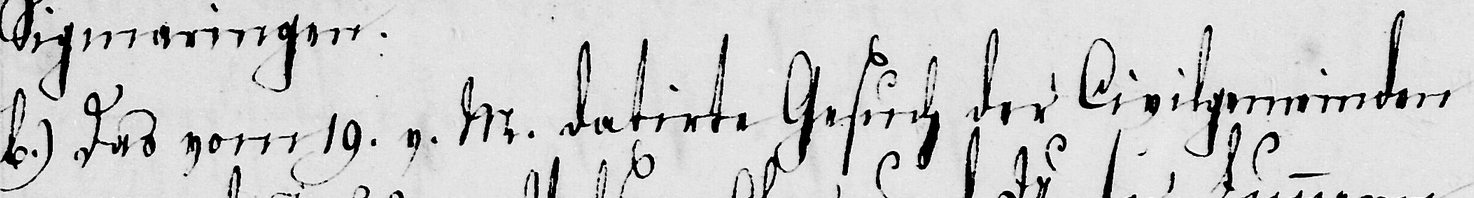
b.) Das vom 19. v. M. datirte Gesuch der Civilgemeinden
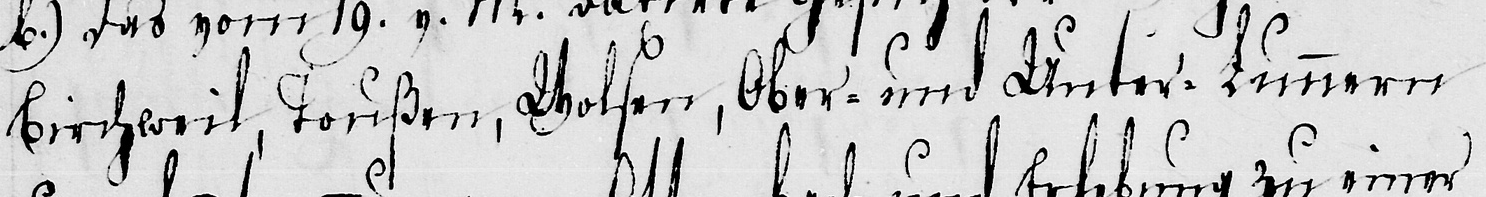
Birchweil, Toußen, Wolsen, Ober- und Unter-Lunnern
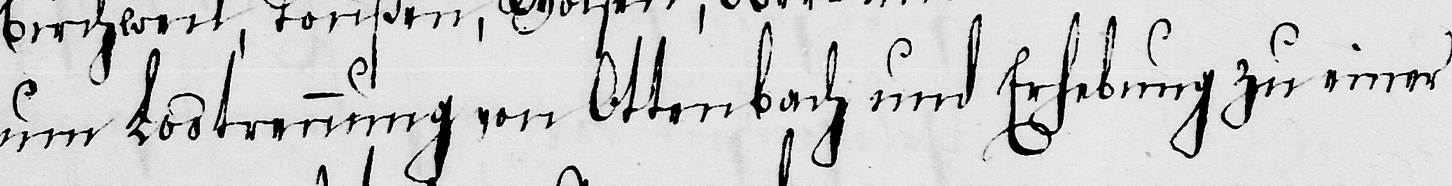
um Lostrennung von Ottenbach und Erhebung zu einer
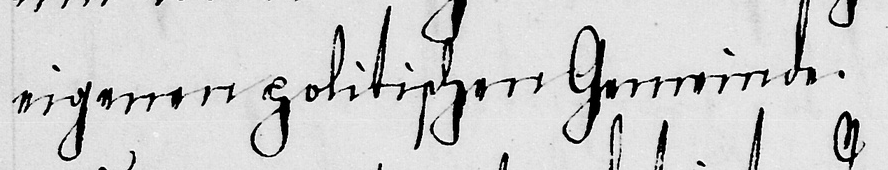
eigenen politischen Gemeinde.
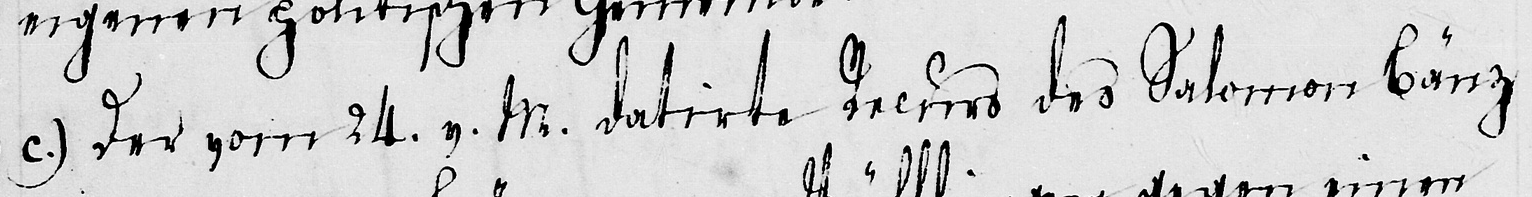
c.) Der vom 24. v. M. datirte Recurs des Salomon Bänz
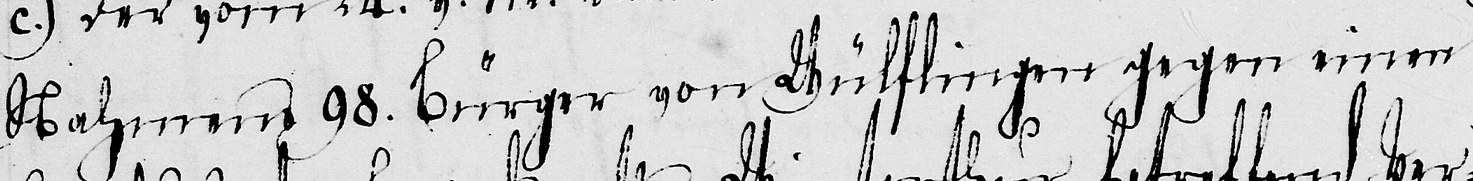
Nahmens 98. Bürger von Wülflingen gegen einen
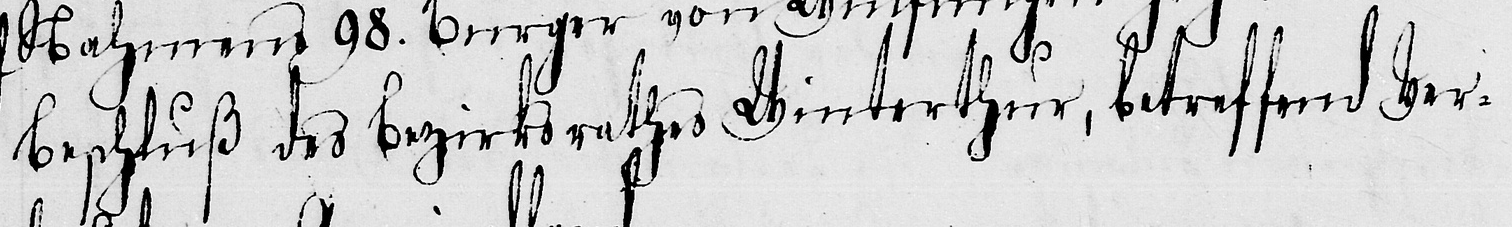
Beschluß des Bezirksrathes Winterthur, betreffend Ver¬
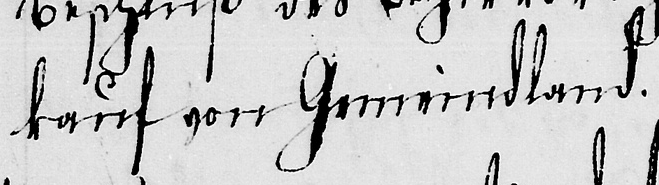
kauf von Gemeindland.
